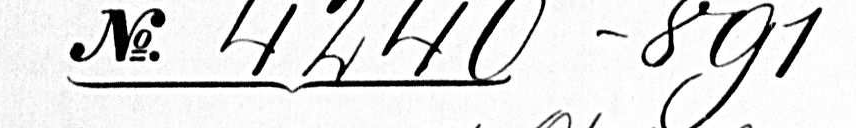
No 4240 – 1891
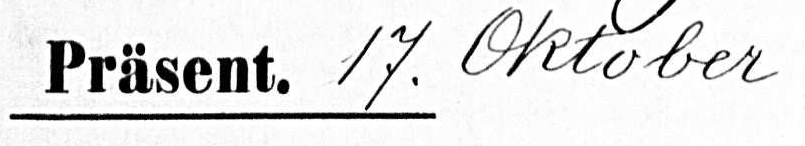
Präsent. – 17. Oktober
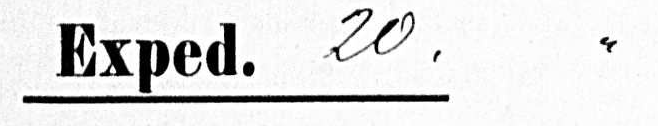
Exped. – 20. „
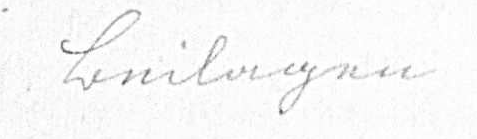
Beilagen
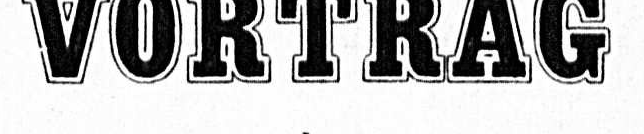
VORTRAG
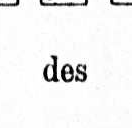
des
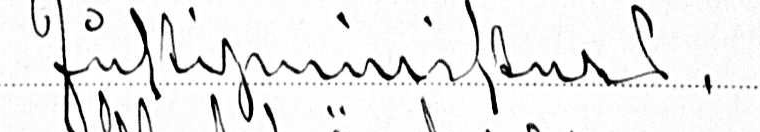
Justizministers,
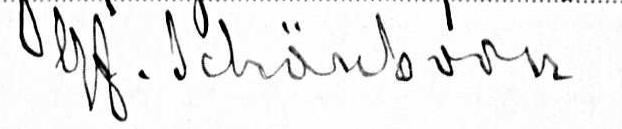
Gf. Schönborn
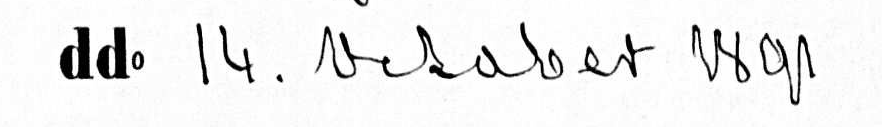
ddo 14. Oktober 1891
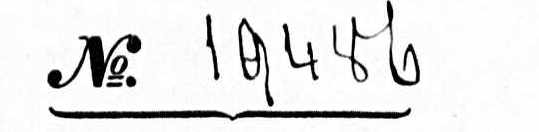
No. 19486
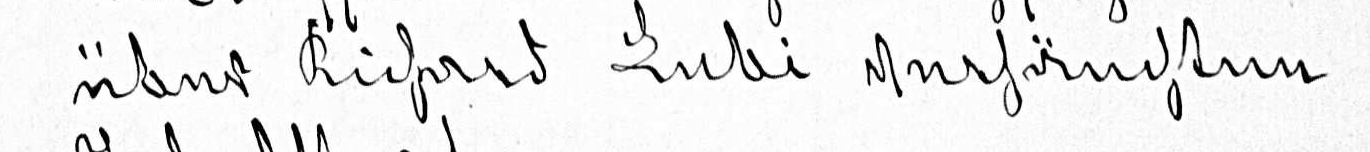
über Richard Lubi verhängten
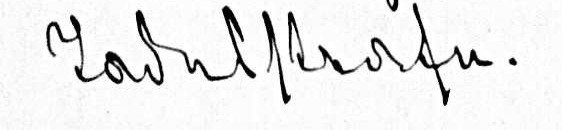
Todesstrafe.
